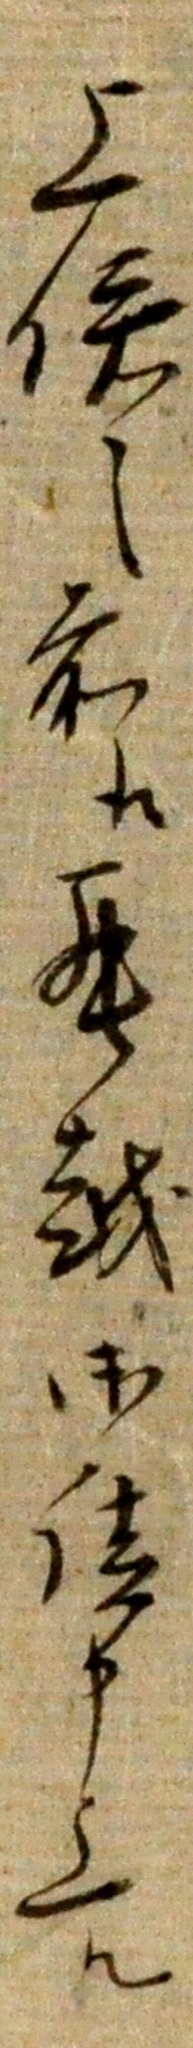上使之前え罷越御請申上候
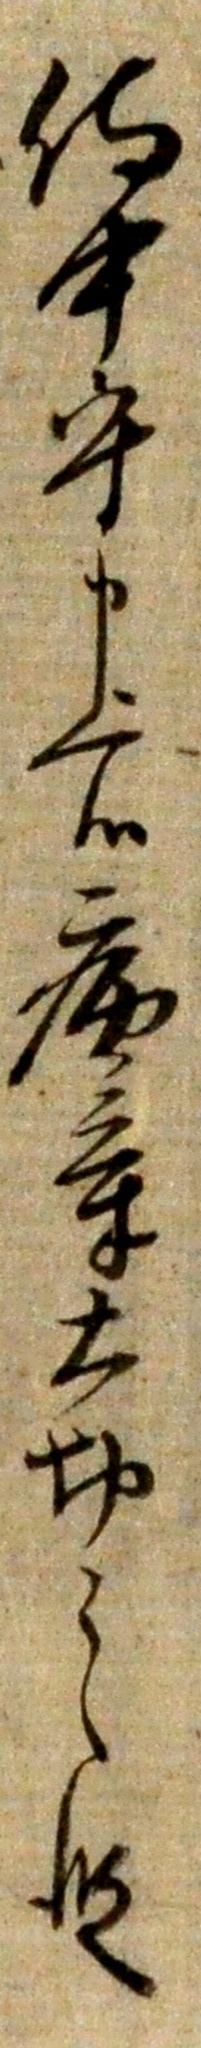備中守申上候病気大切之段
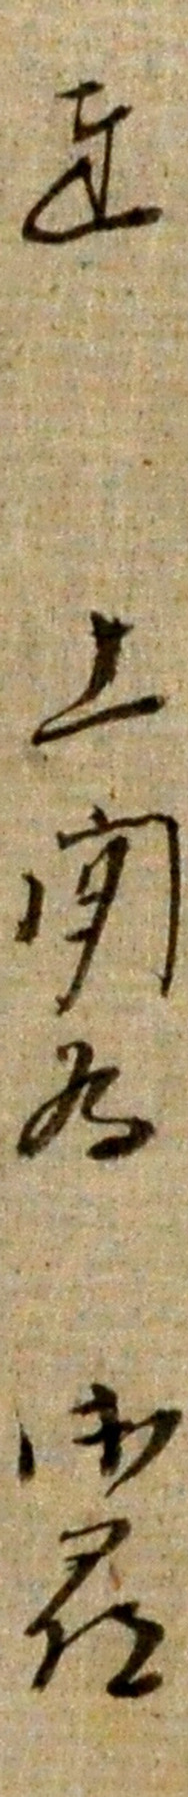達上聞為御尋
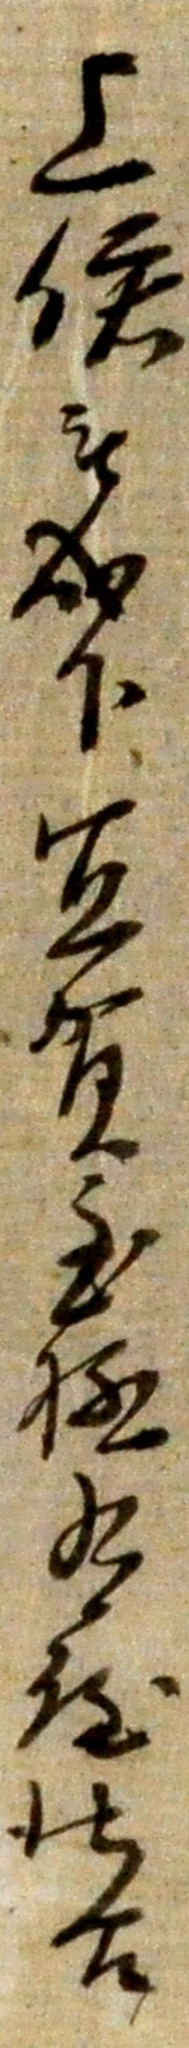上使被成下冥賀至極有難仕合
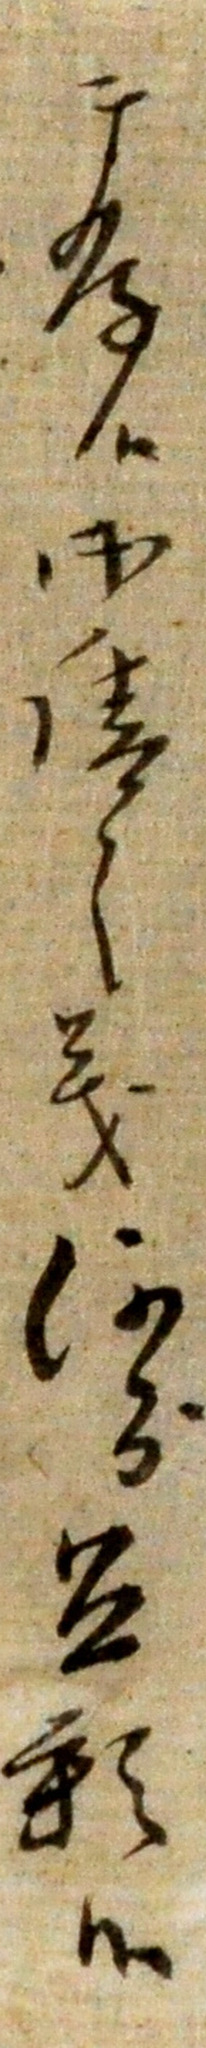奉存候御請之義何分宜頼候
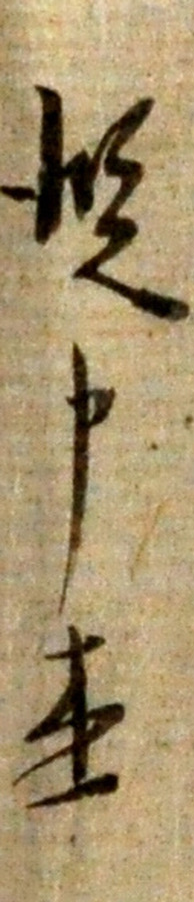段申述
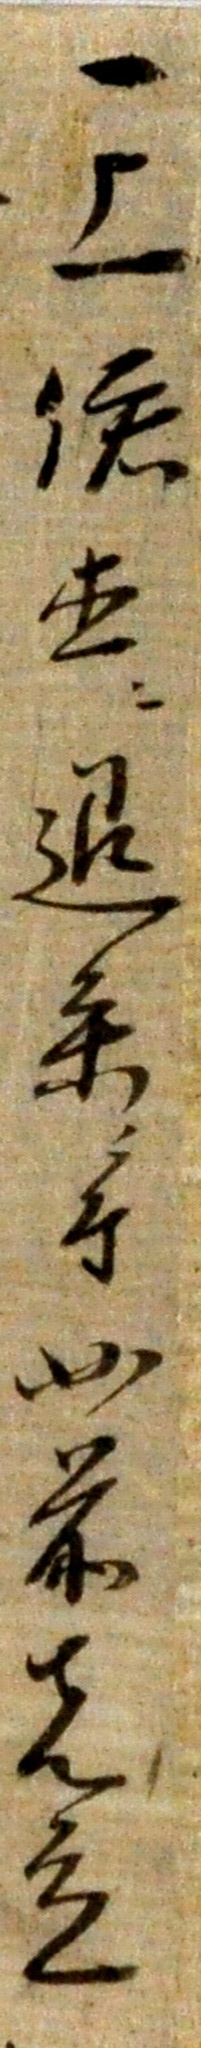一上使直ニ退参ニ付此前先立
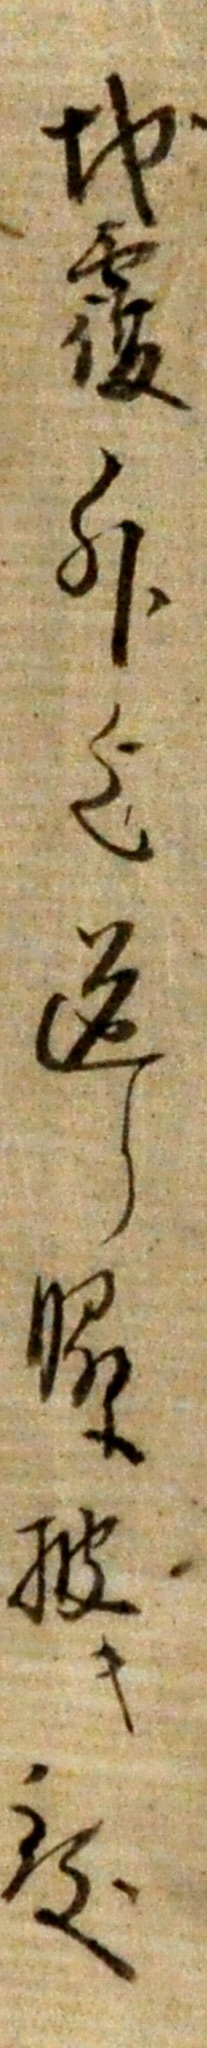地覆外迄送り脇え披キ致
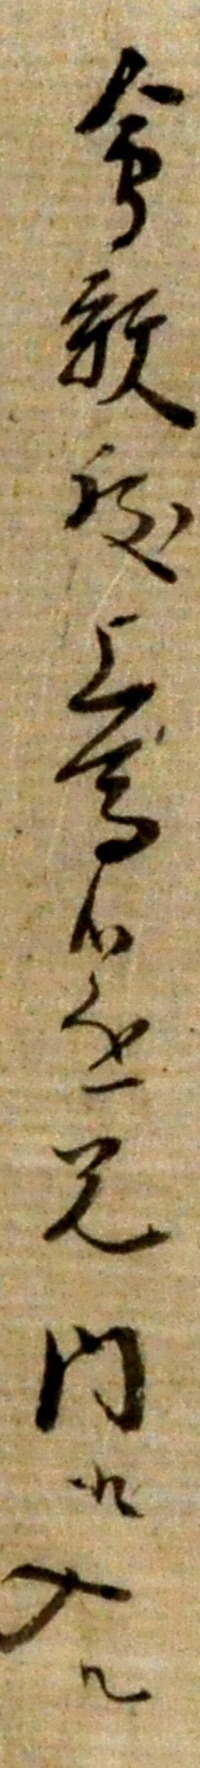会釈致上馬候を見内え入候

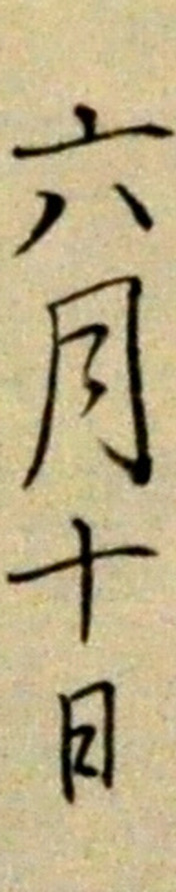六月十日
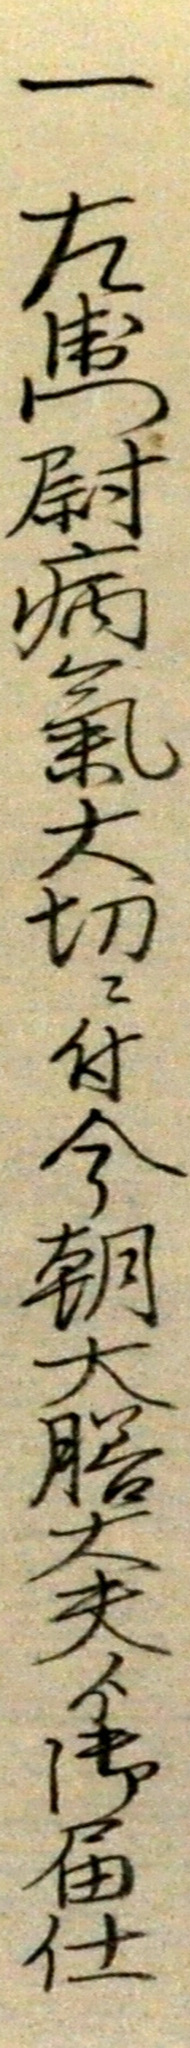一左衛門尉病気大切ニ付今朝大膳大夫ゟ御届仕
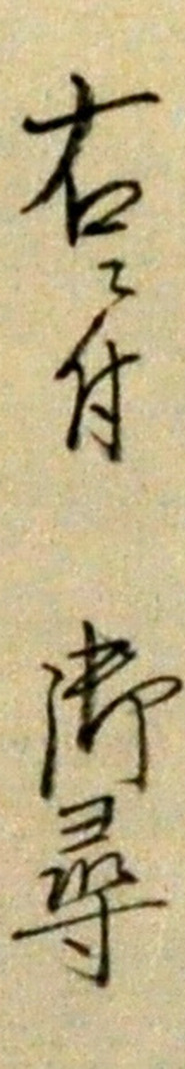右ニ付御尋
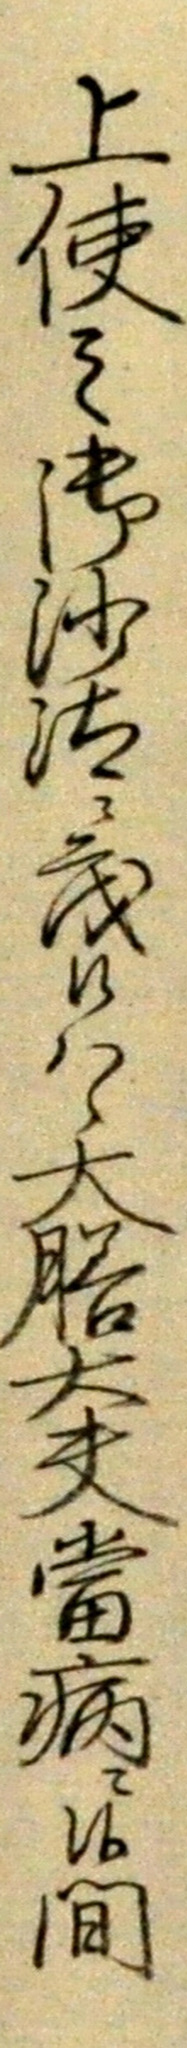上使之御沙汰ニも候ハヽ大膳大夫病気ニ候間
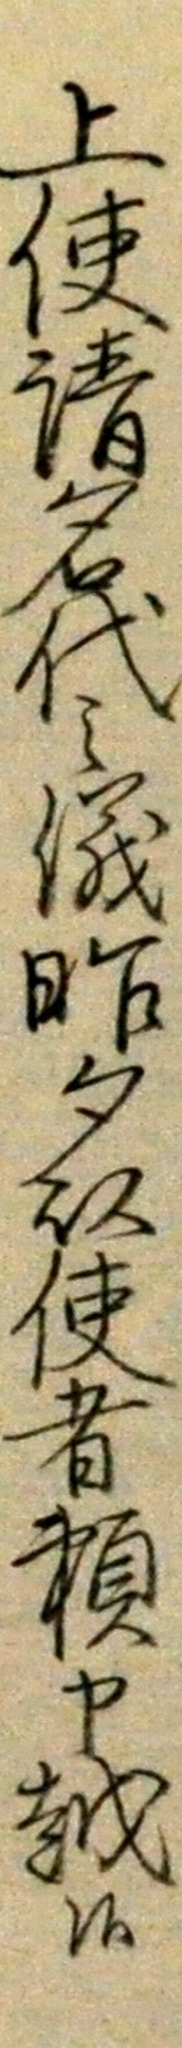上使請名代之儀昨夕以使者頼申越候
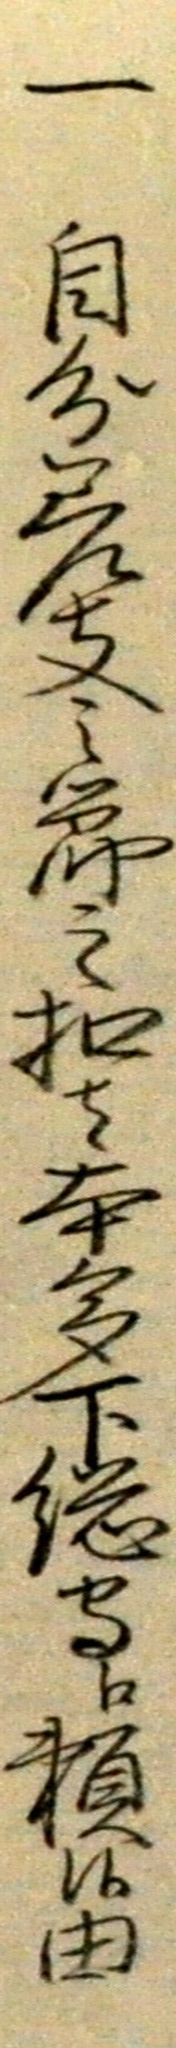一自分差支之節之扣は本多下総守え頼候由
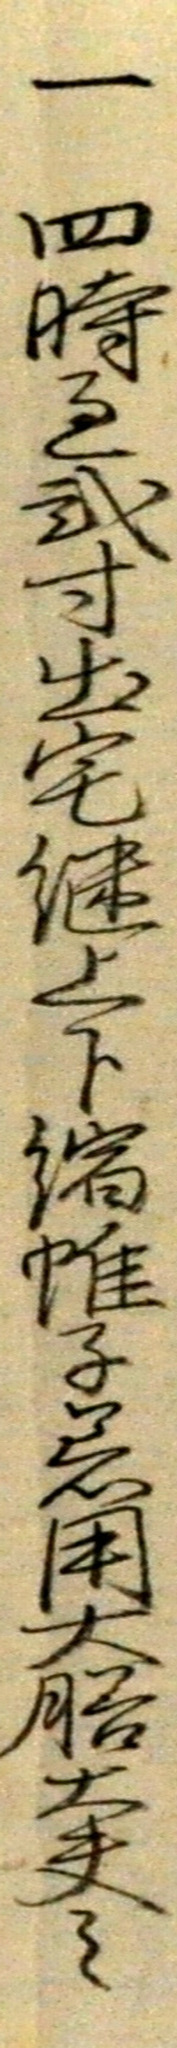一四時過弐寸出宅継上下縮帷子着用大膳大夫之
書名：上使仰付ラレ候節ノ留外
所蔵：伊那市立高遠町図書館・合同会社AMANE
